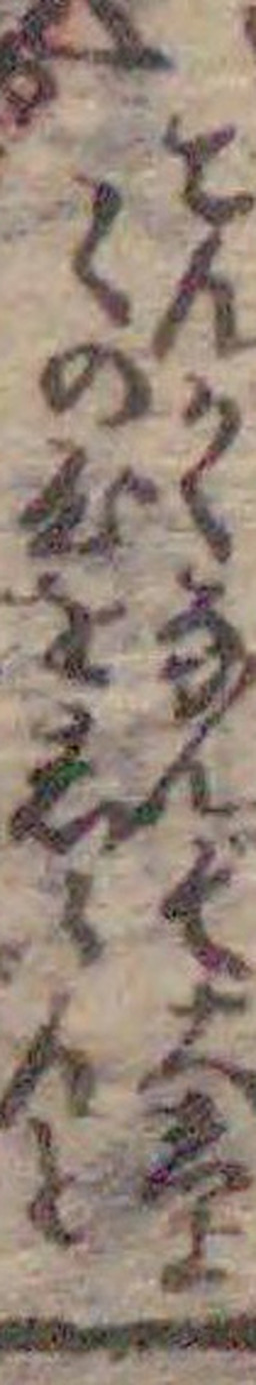くの心？をしらんと
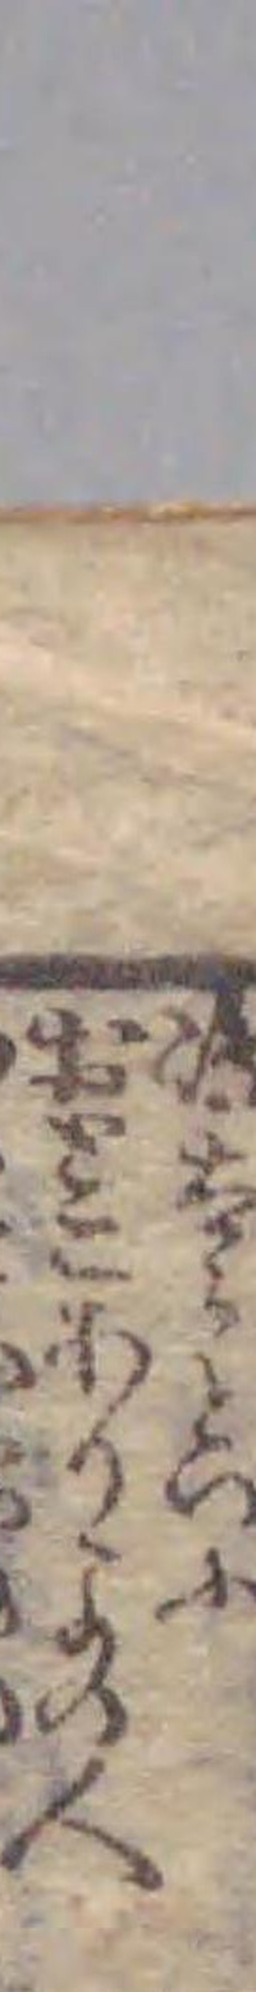おとこありよの人
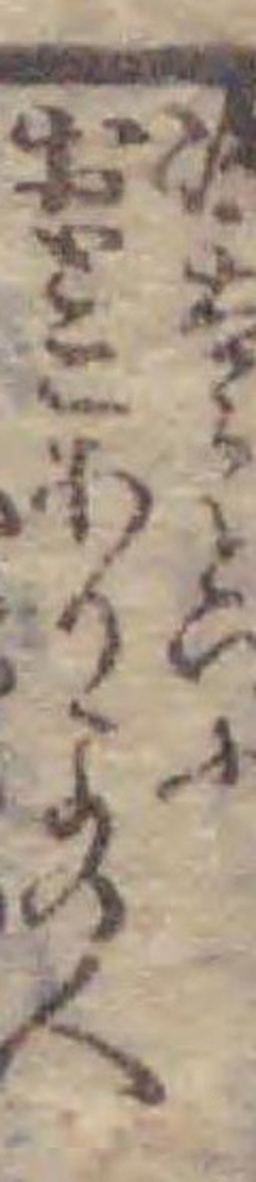おとこありよの人
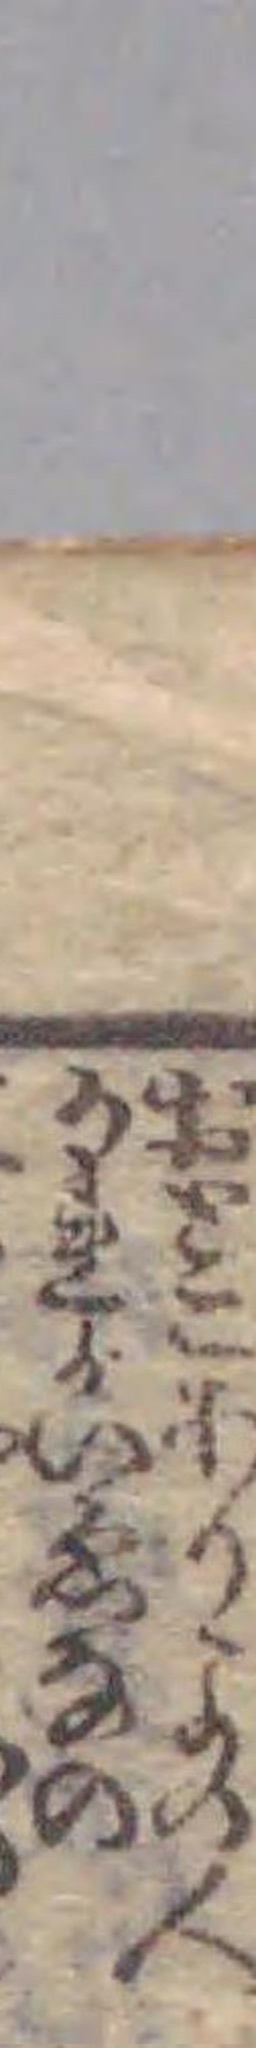かれがいゑの名の
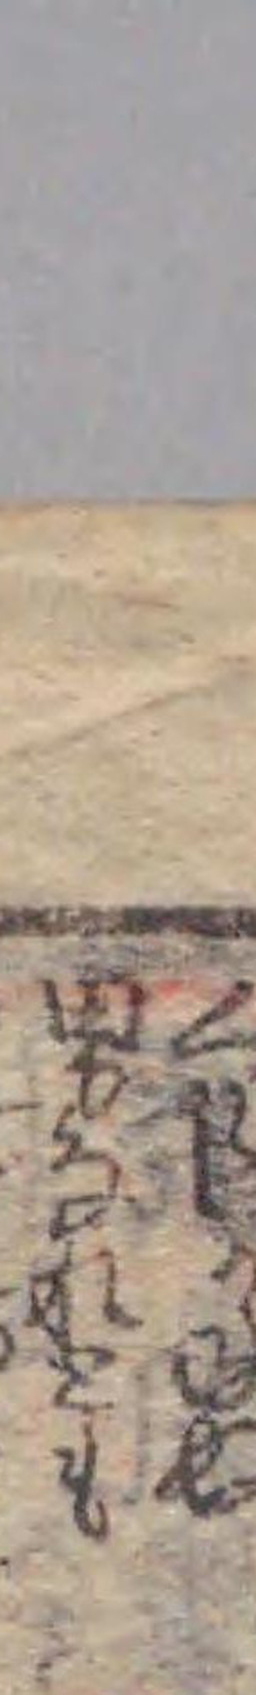男なれとも
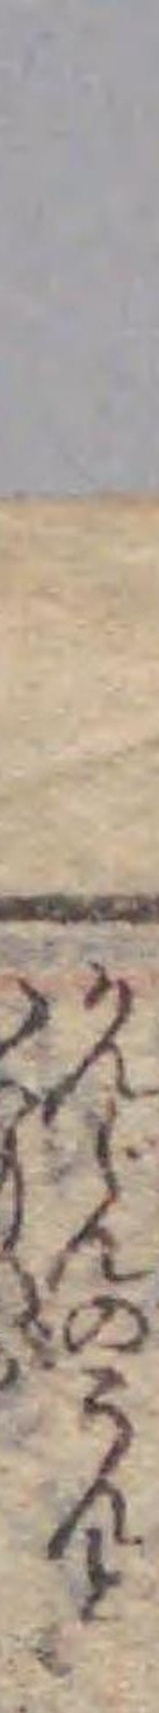かんじんのうんと
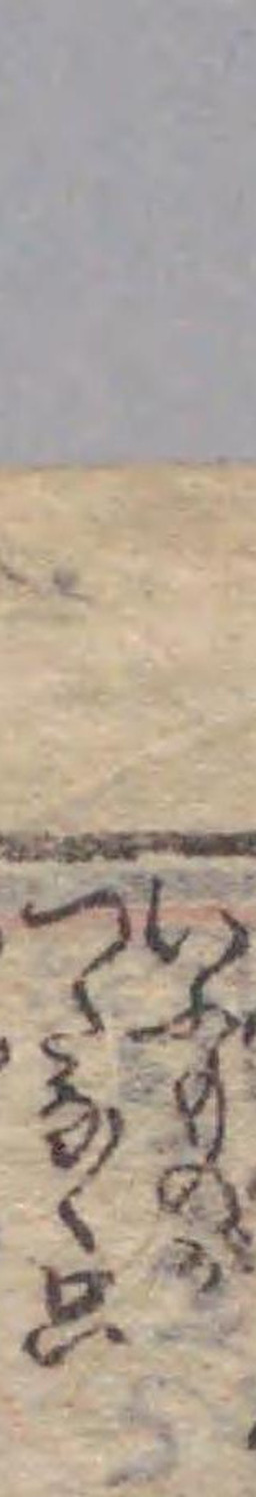つたなく只
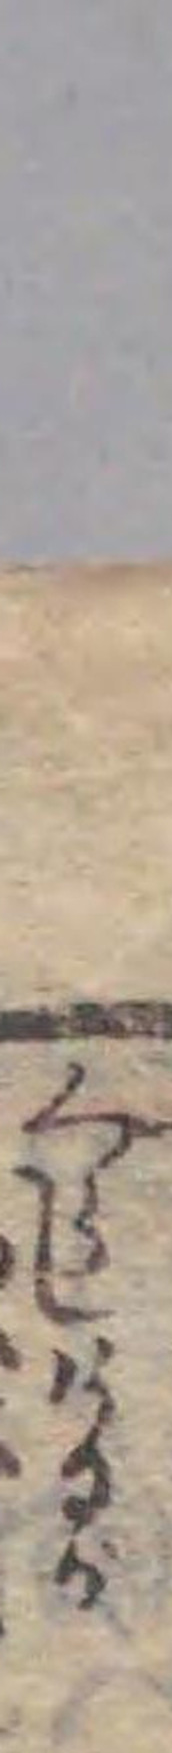くらしけるが
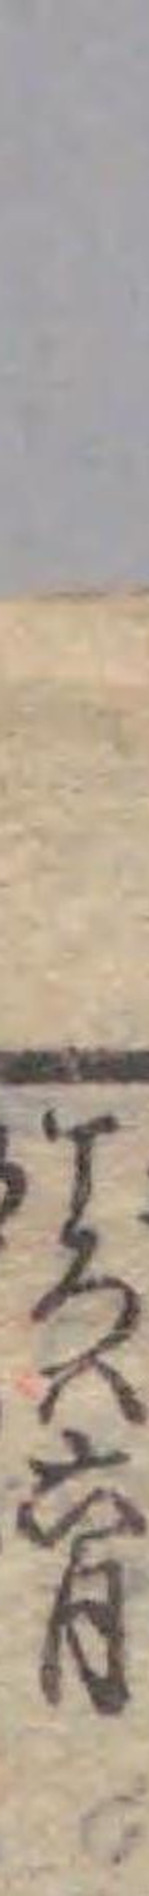ころは六月
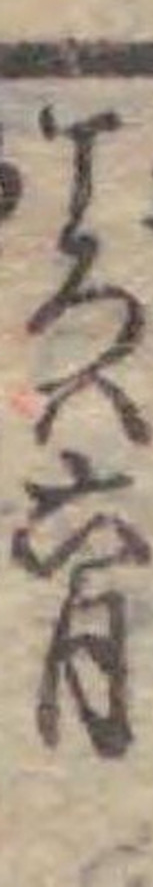ころは六月
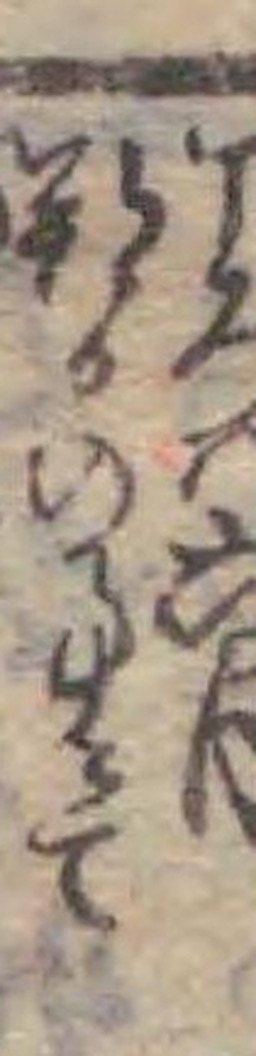朔日の事にて
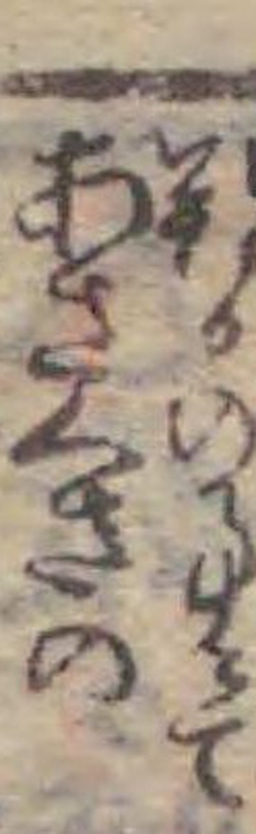あさくさの
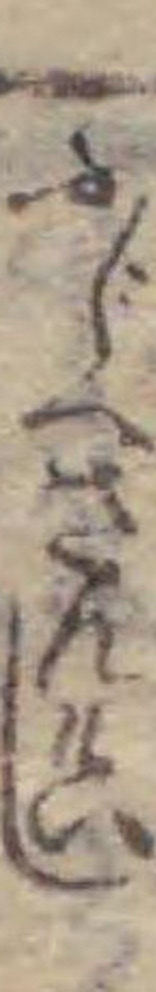ふじへさんけいし
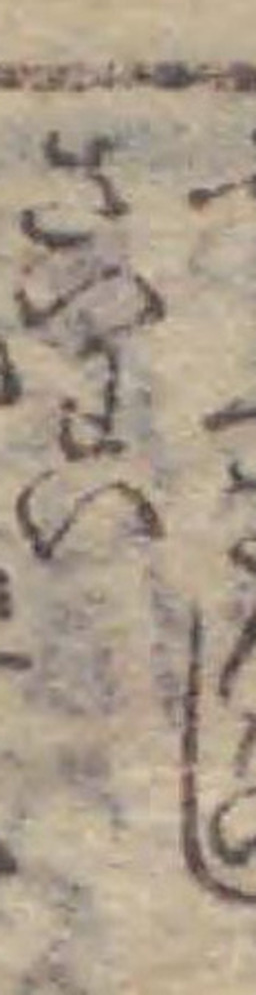さいわい
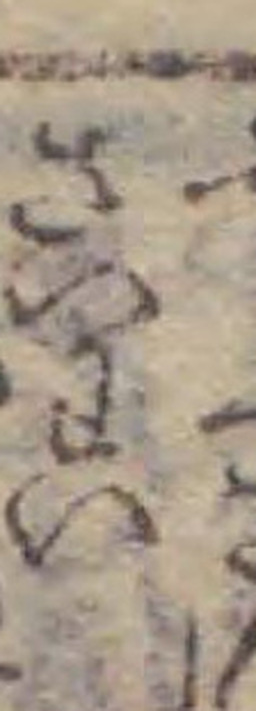さいわい
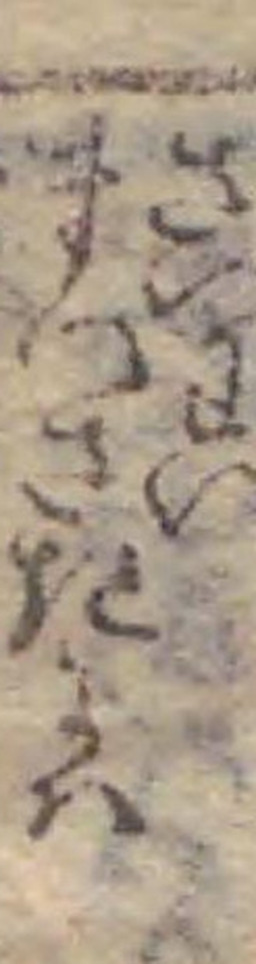まつさきには
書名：竜宮苦界玉手箱 : 3巻
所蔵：国立国会図書館 National Diet Library, JAPAN
